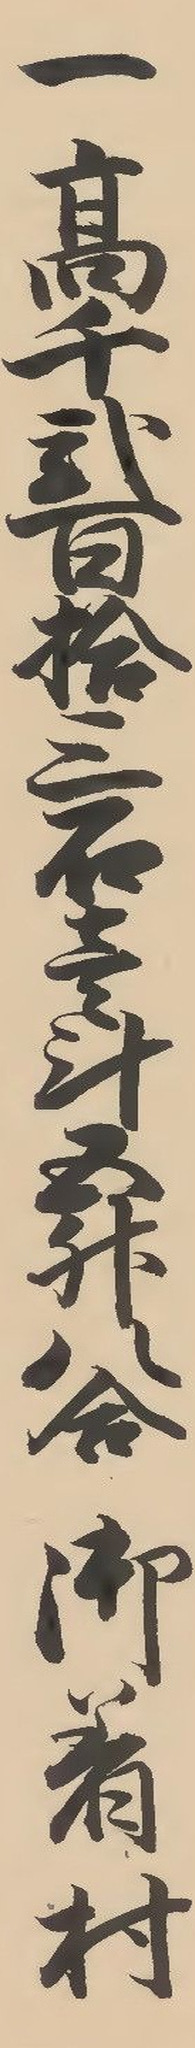一髙千弐百拾三石壱斗五升八合御着村
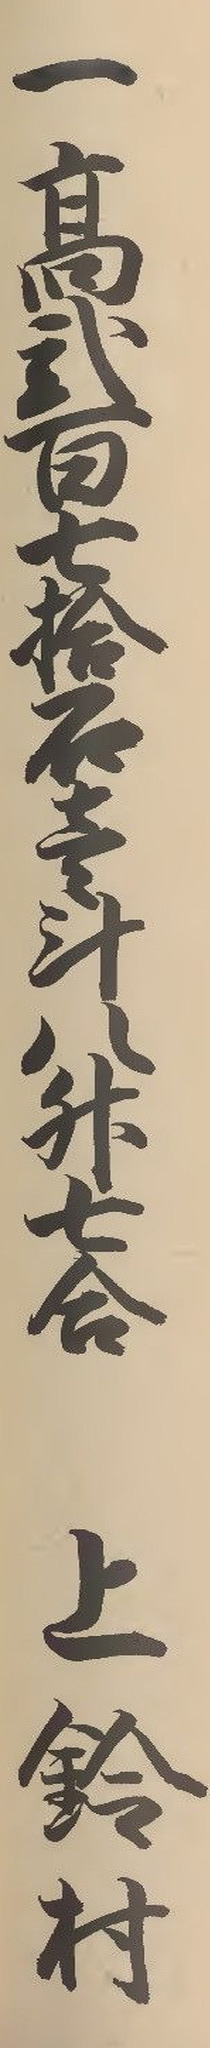一髙弐百七拾石壱斗八升七合上鈴村
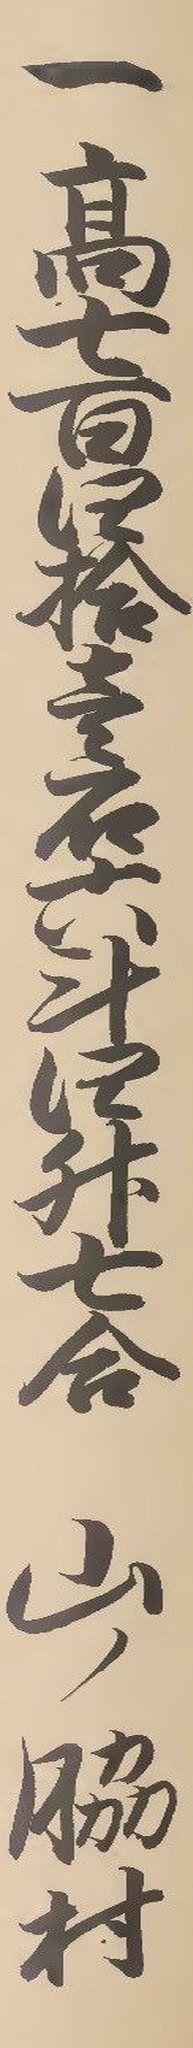一髙七百四拾壱石六斗四升七合山ノ脇村
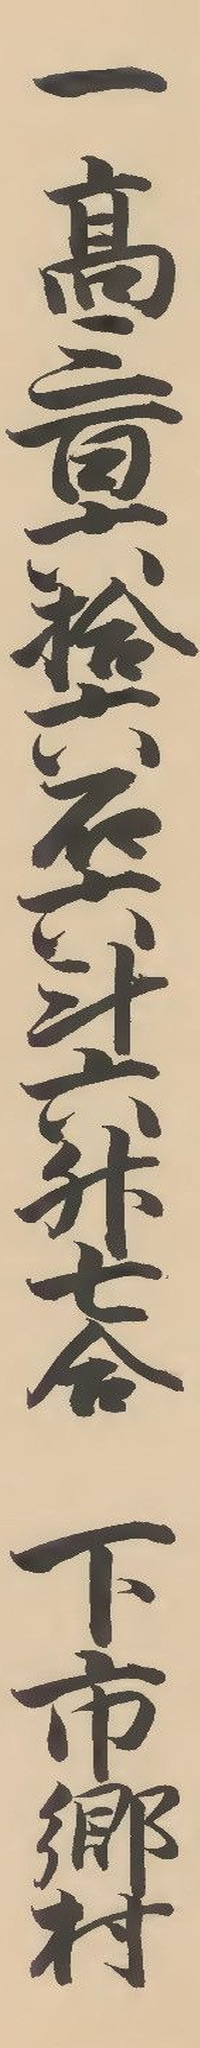一髙三百六拾六石六斗六升七合下市郷村
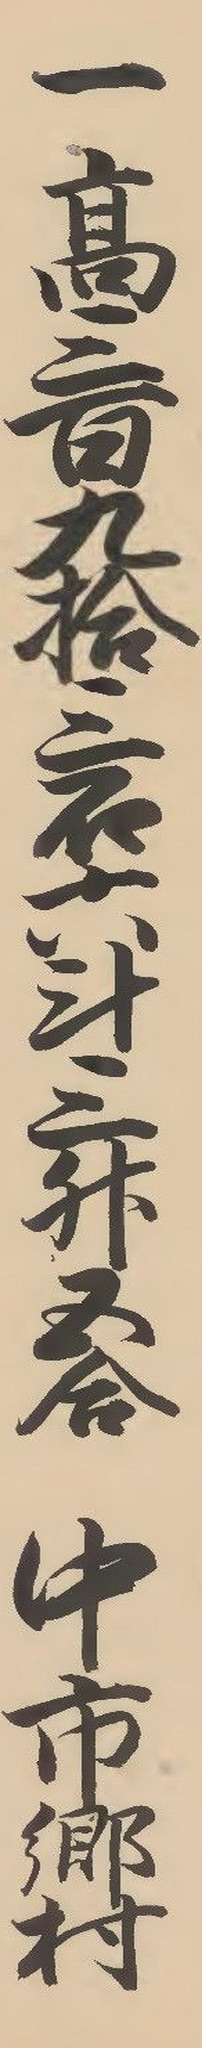一髙三百九拾三石六斗三升五合中市郷村
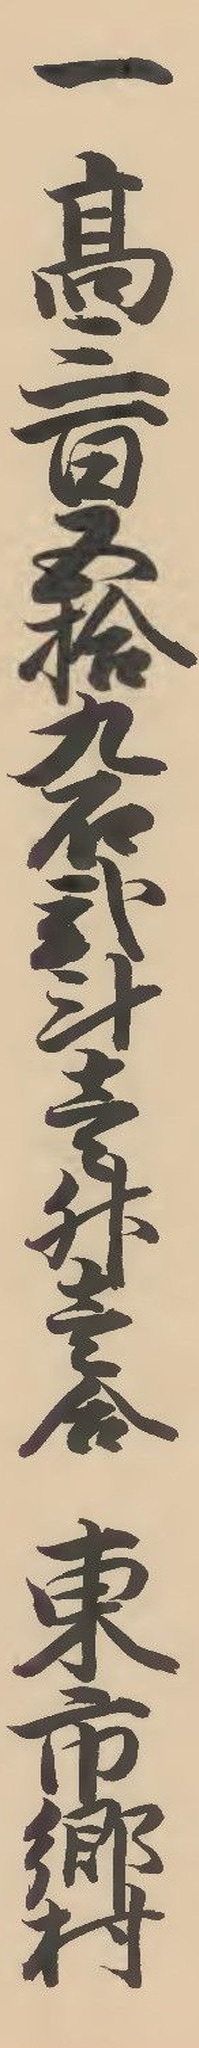一髙三百五拾九石弐斗壱升壱合東市郷村

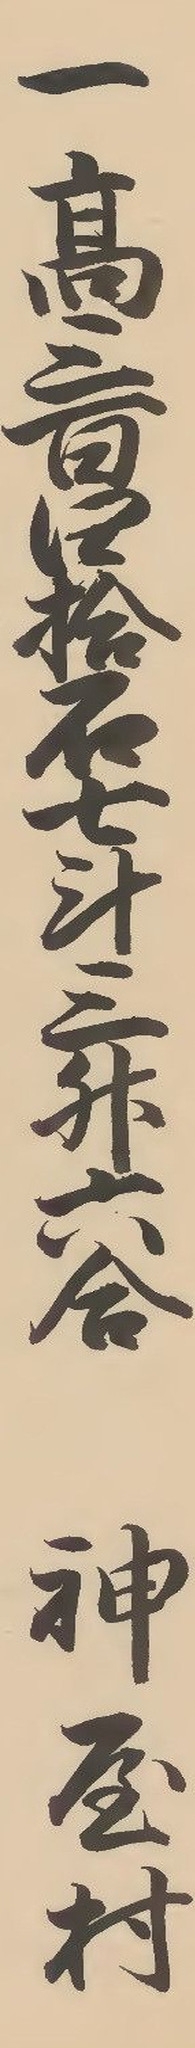一髙三百四拾石七斗三升六合神屋村
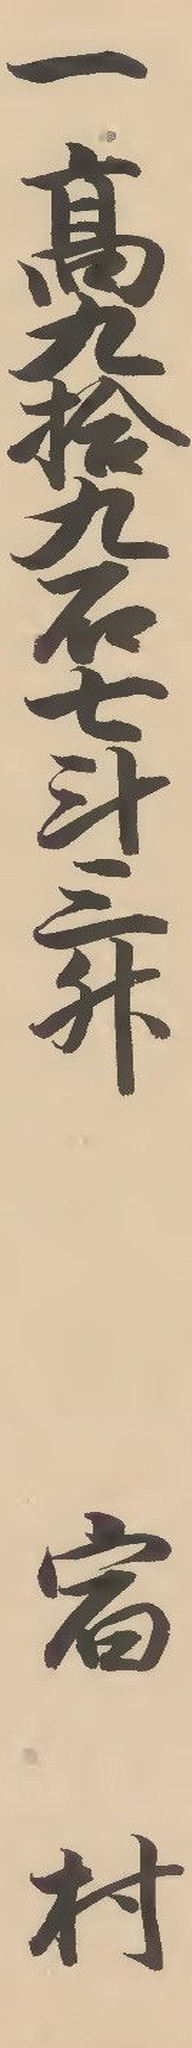一髙九拾九石七斗三升宿村
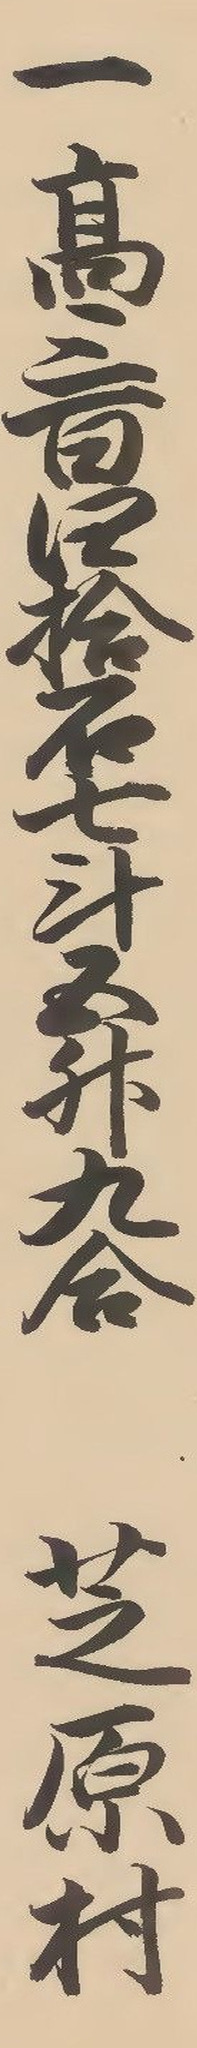一髙三百四拾石七斗五升九合芝原村
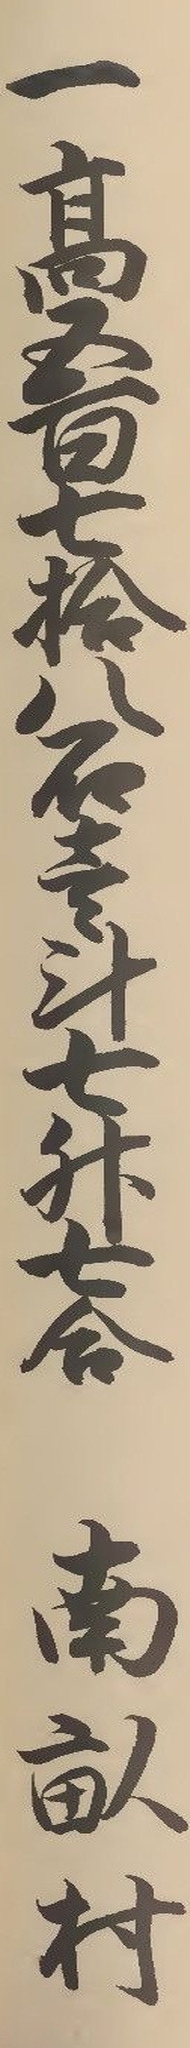一髙五百七拾八石壱斗七升七合南畝村
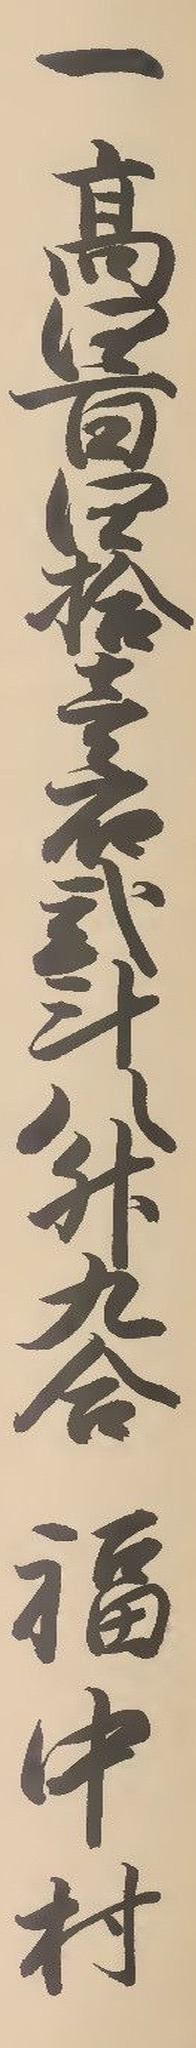一髙四百四拾壱石弐斗八升九合福中村
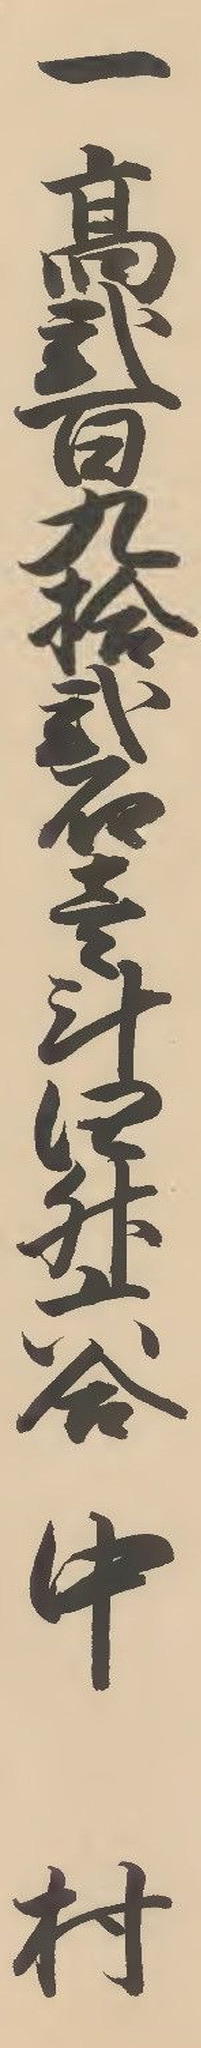一髙弐百九拾弐石壱斗四升六合中村
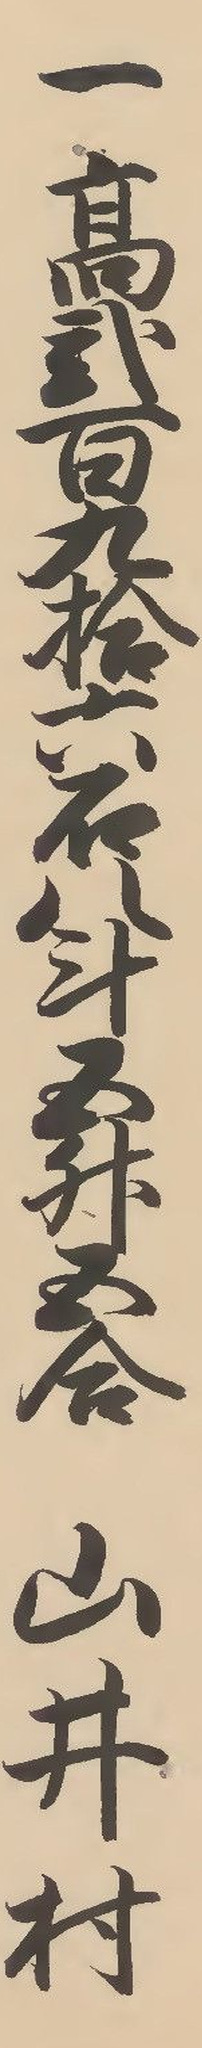一髙弐百九拾六石八斗五升五合山井村
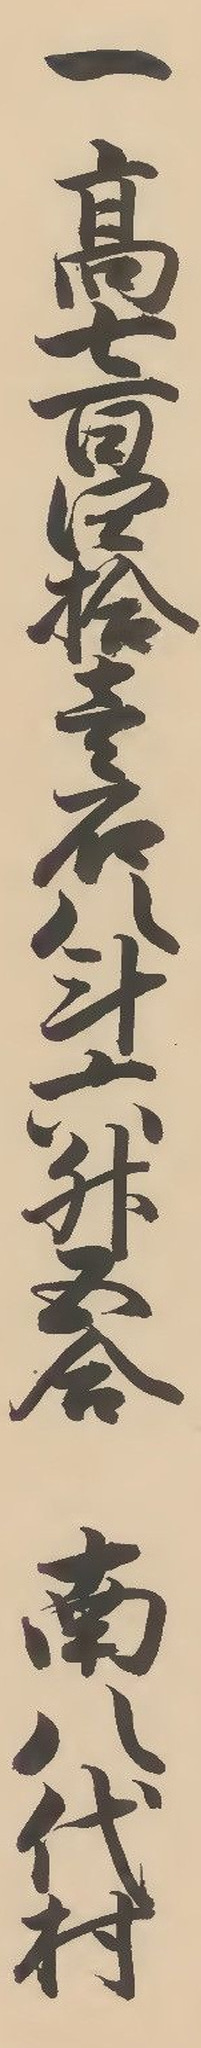一髙七百四拾壱石八斗六升五合南八代村

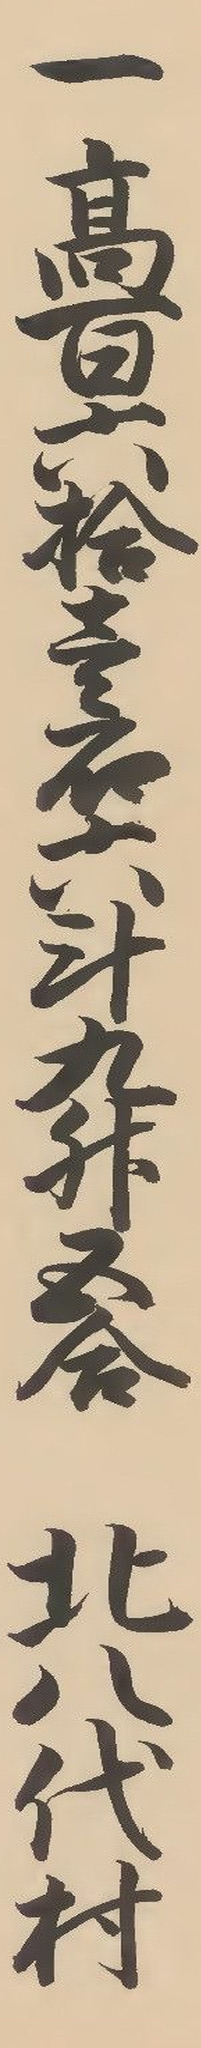一髙百六拾壱石六斗九升五合北八代村
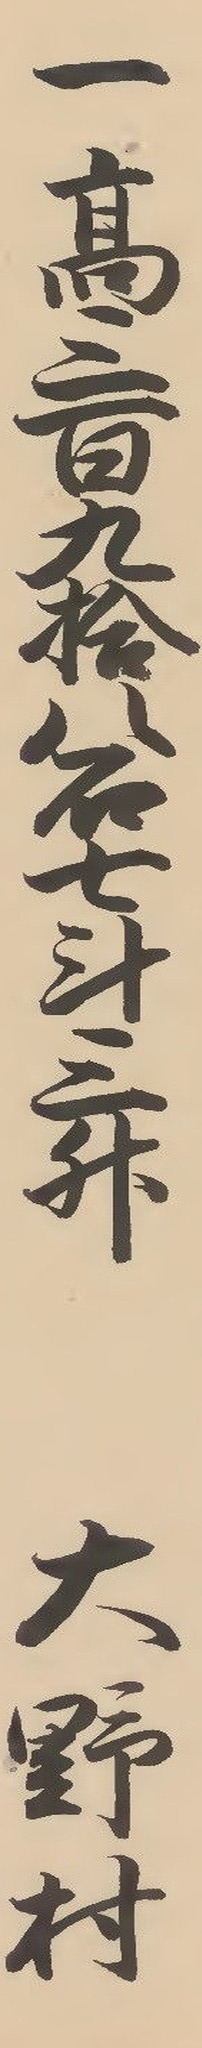一髙三百九拾八石七斗三升大野村
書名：播磨国郷帳
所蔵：国立公文書館 National Archives of Japan
